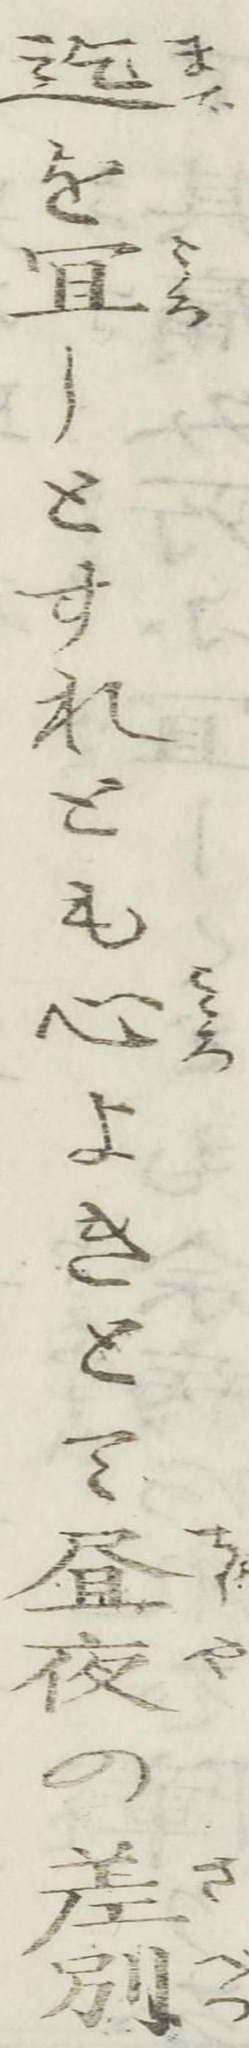迄を宜しとすれとも心よきとて昼夜の差別
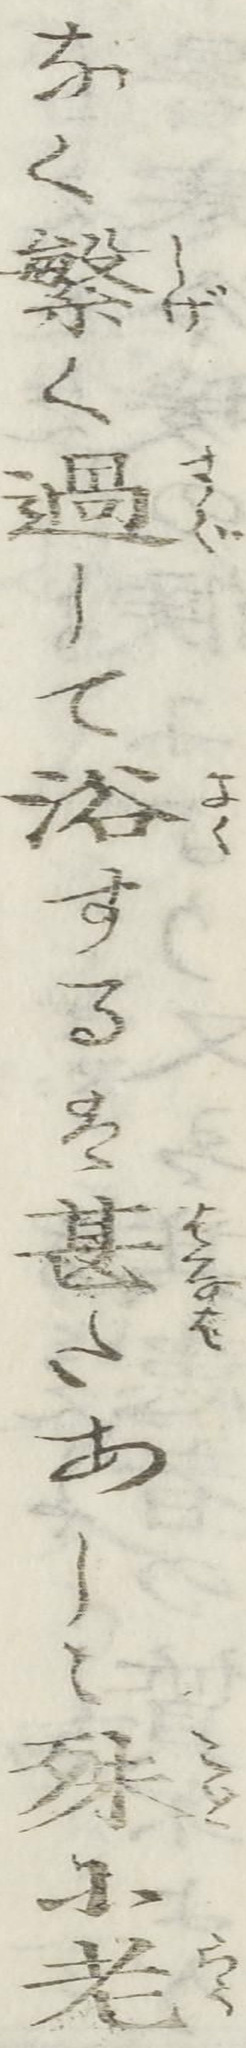なく繁く過して浴するは甚たあしく殊に老
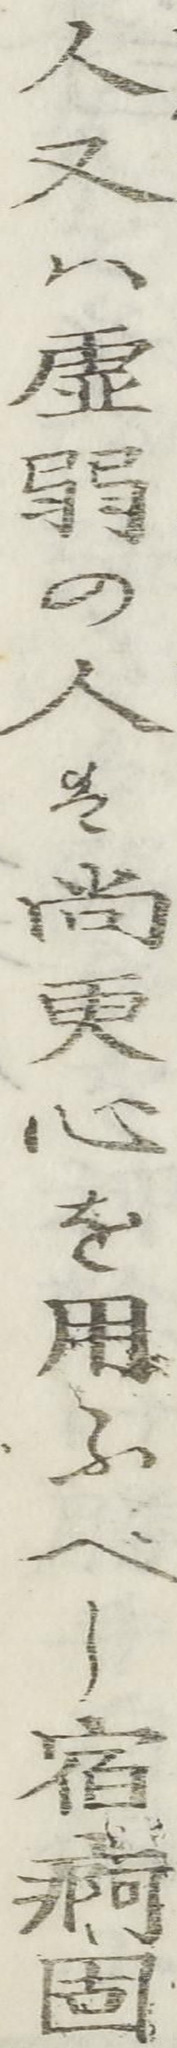人又は虚弱の人は尚更心を用ふべし宿痾固
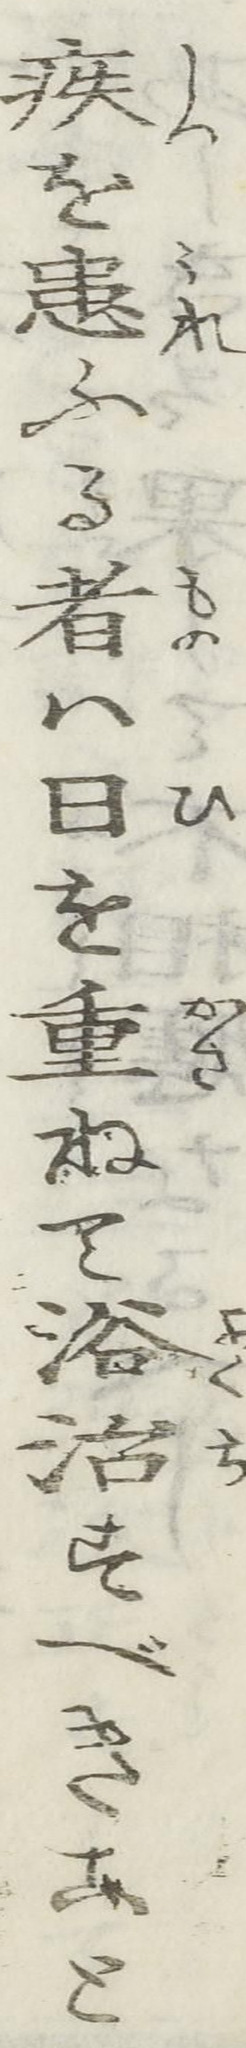疾を患ふる者は日を重ねて浴治すべきこと
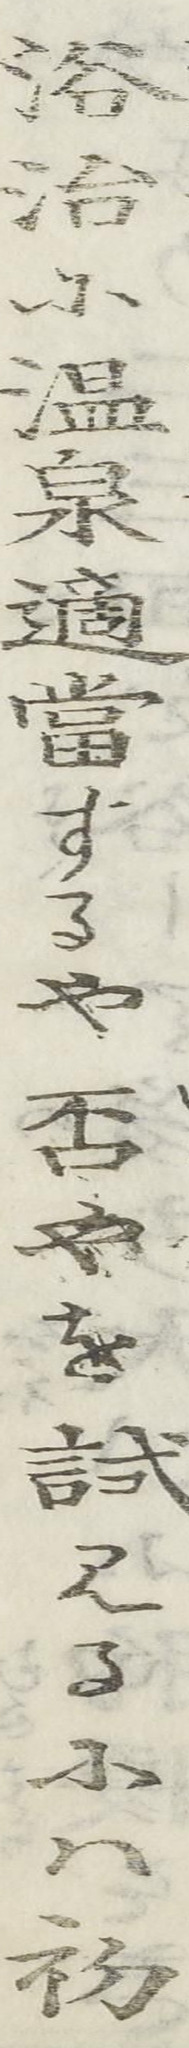浴治に温泉適当するや否やを試見るには初

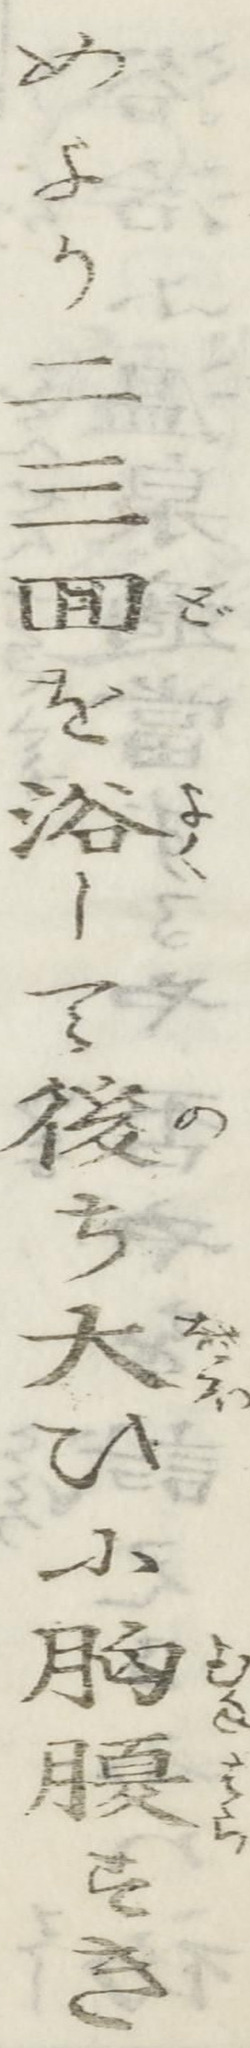めより二三回を浴して後ち大ひに胸腹すき
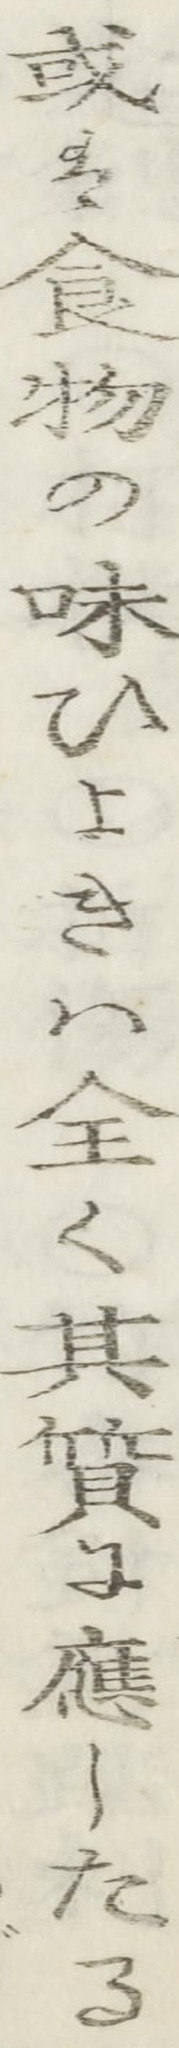或は食物の味ひよきは全く其質に応したる
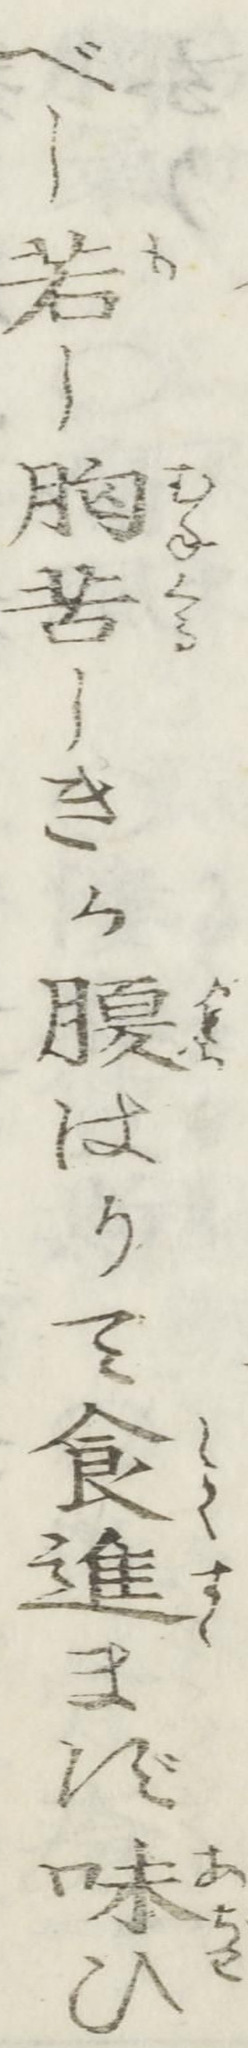べし若し胸苦しきか腹はりて食進まず味ひ
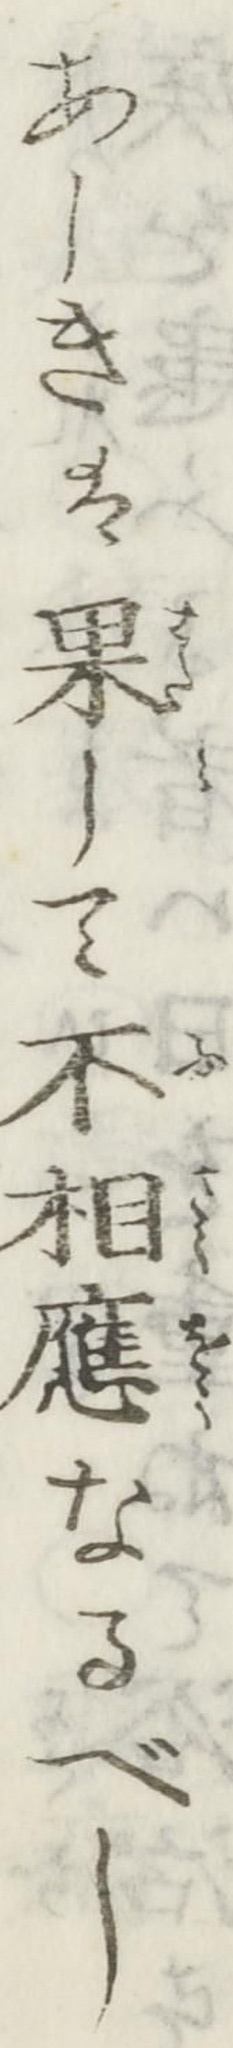あしきは果して不相応なるべし
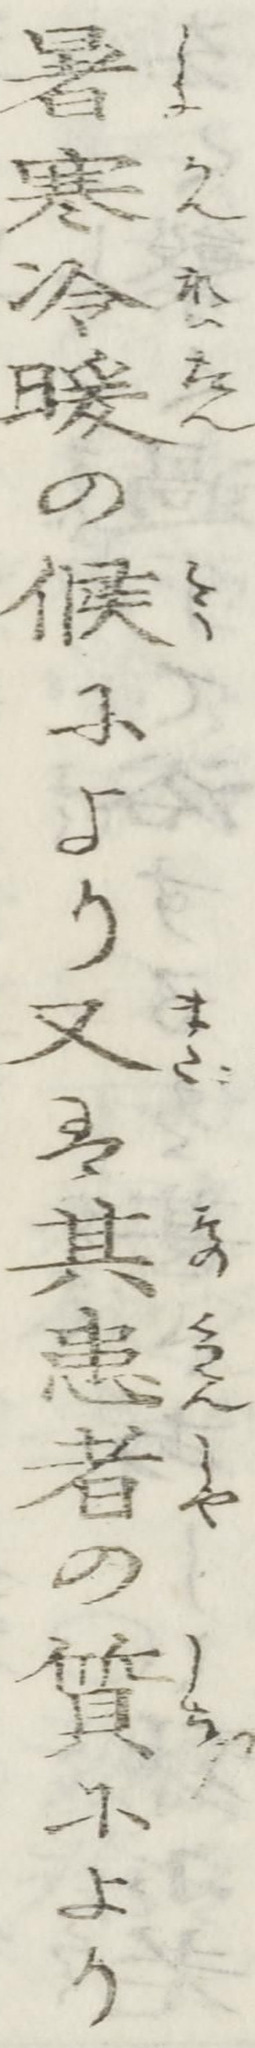暑寒冷暖の候により又は其患者の質により
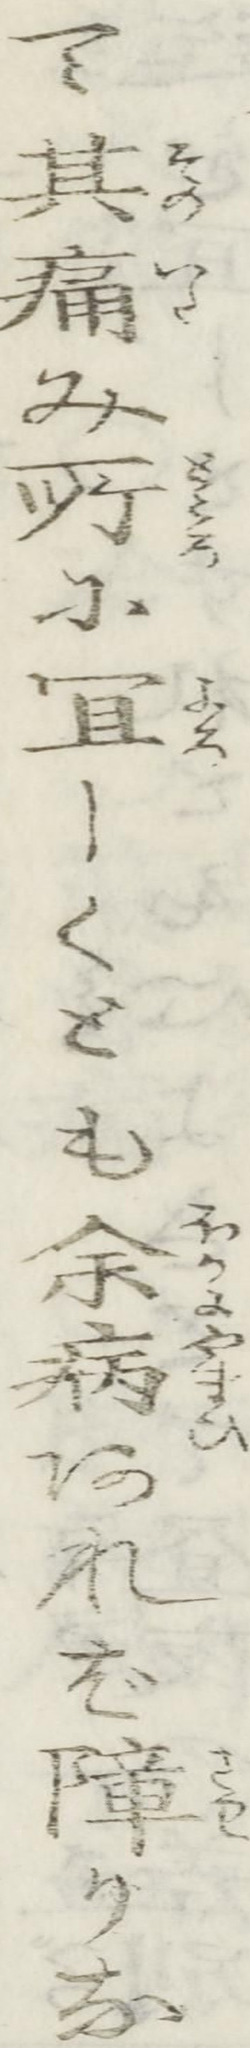て其痛み所に宜しくとも余病あれば障りな
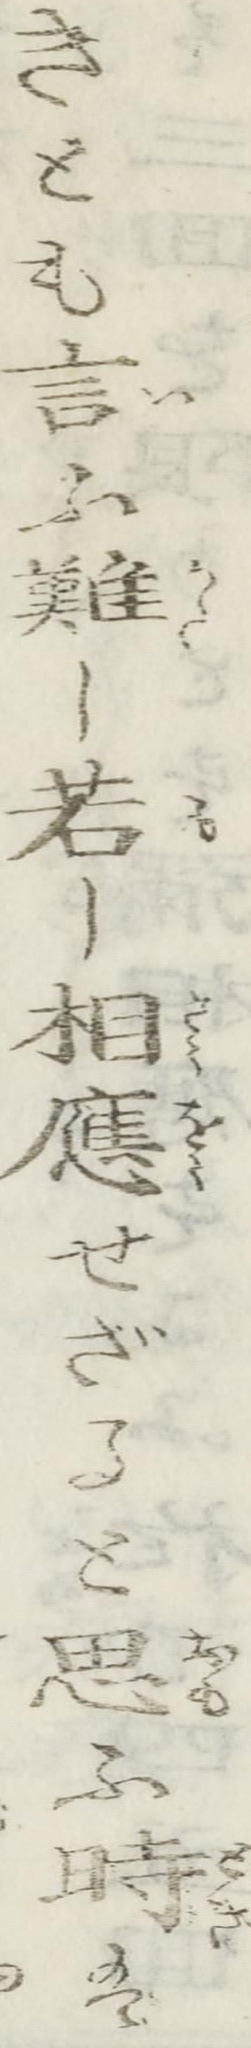きとも言ふ難し若し相応ぜざると思ふ時は
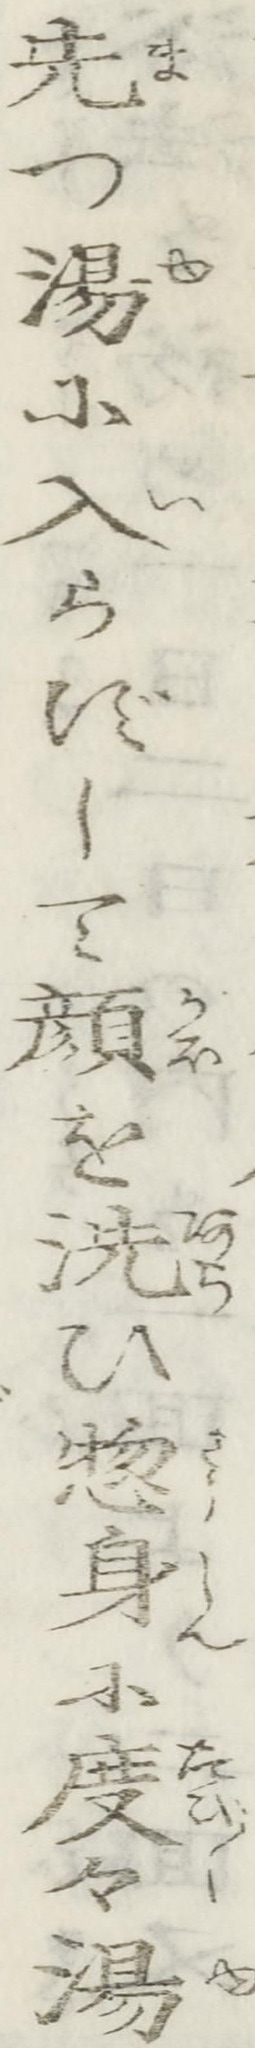先つ湯に入らずして顔を洗い惣身に度々湯
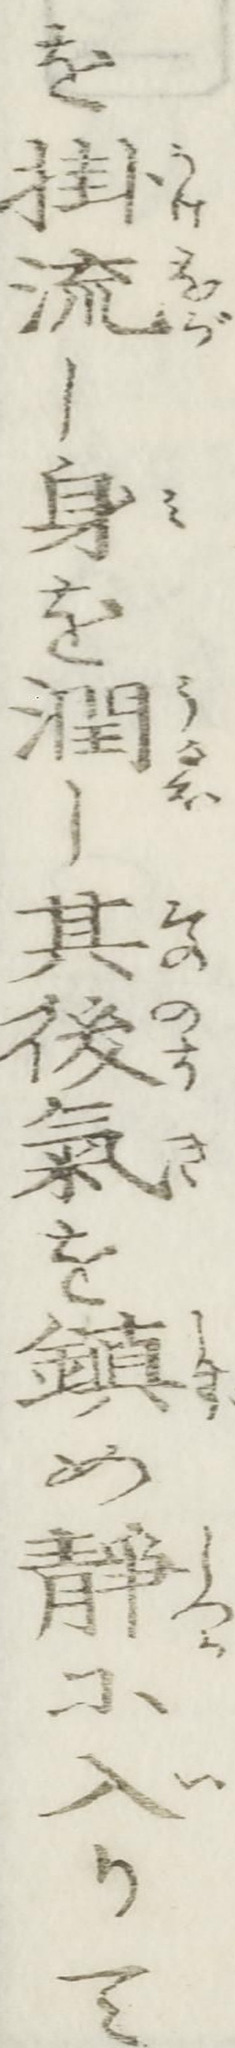を掛流し身を潤し其後気を鎮め静に入りて
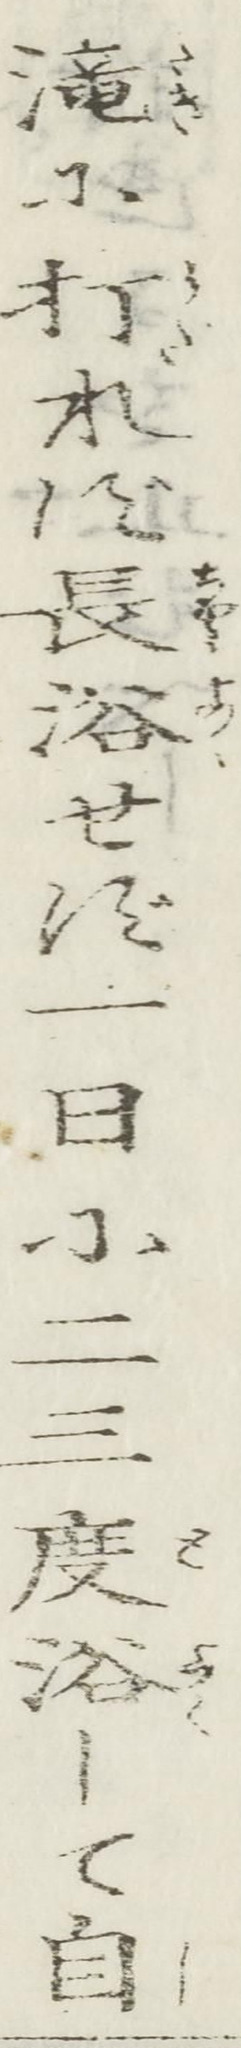滝に打れず長浴せず一日に二三度浴して自
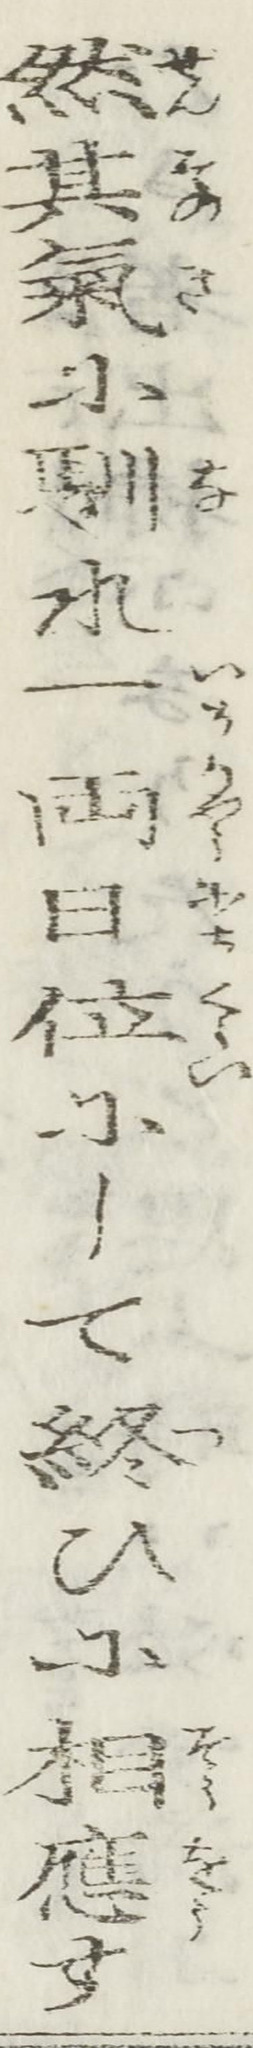然其気に馴れ一両日位にして終ひに相応す
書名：鎌先温泉由來記
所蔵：東京大学地震研究所図書室 Earthquake Research Institute Library, The University of Tokyo, JAPAN
